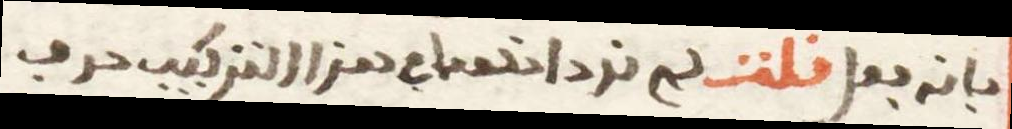بانه حرف قلت لم نرد بانهما في هذا التركيب حرف
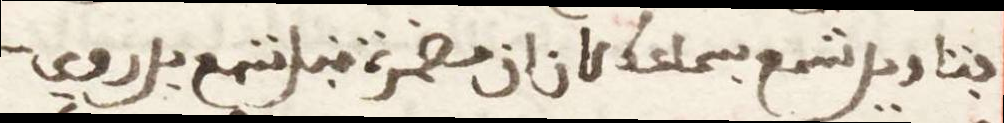فتاويل تسمع بسماعك لان ان مضمرة قبل تسمع بل روي
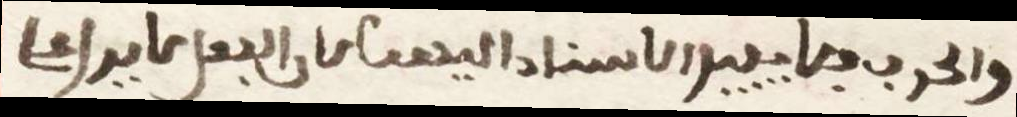والحرف فلا يفيد الاسناد اليهما لان الفعل لا يدل على
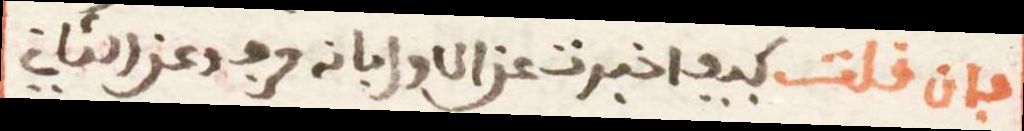فان قلت كيف اخبرت عن الأول بانه حرف وعن الثاني
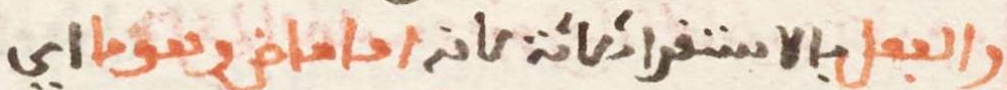والفعل بالاستقراء كانه اما ماض وهوما أي
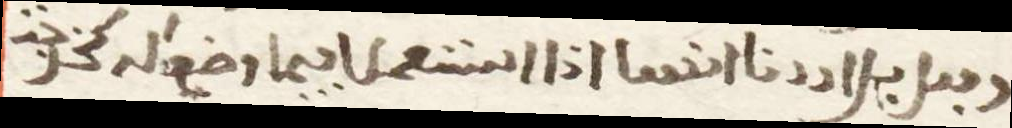وفعل بل اردنا بانهما اذا استعملا فيما وضعا له كخرجت
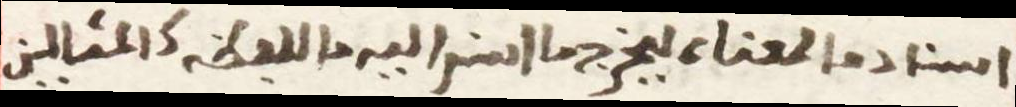اسناد ما لمعناه ليخرج ما اسند اليه ما للفظه كالمثالين المذكورين
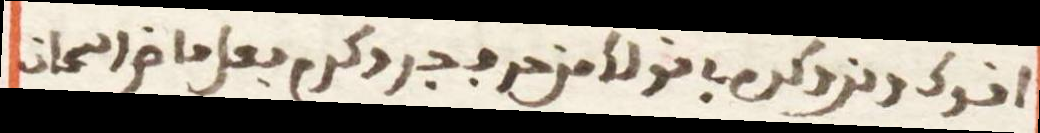اخوك ونرد كرم في قولك من حرف جر وكرم فعل ماض اسمان
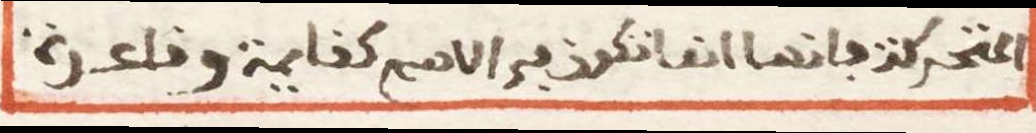المتحركة فانها انما تكون في الاسم كقائمة وقاعدة
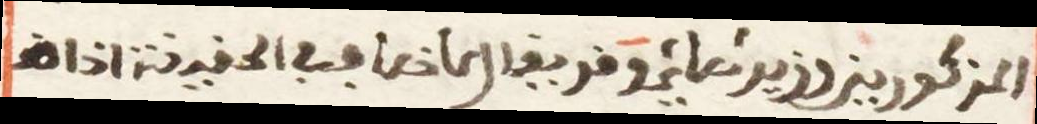وزيد نمائي وفريقا لاخلاف في الحقيقية إذا قال
